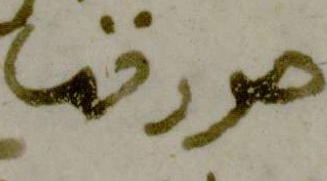صورتها
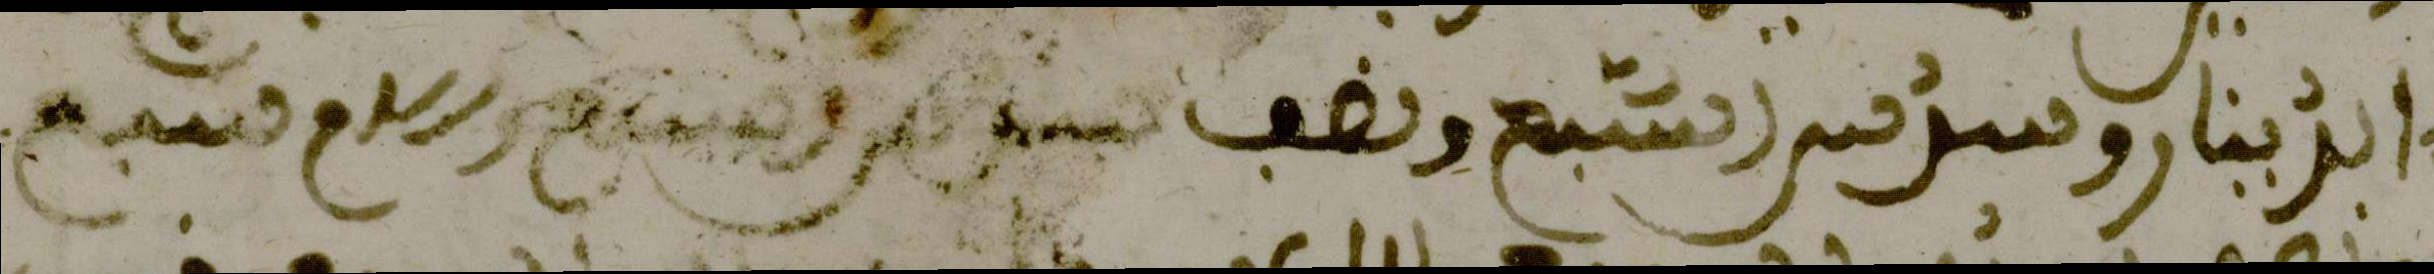الدينار وسدس السَّلع ونصف سدس والسبع الام سبع
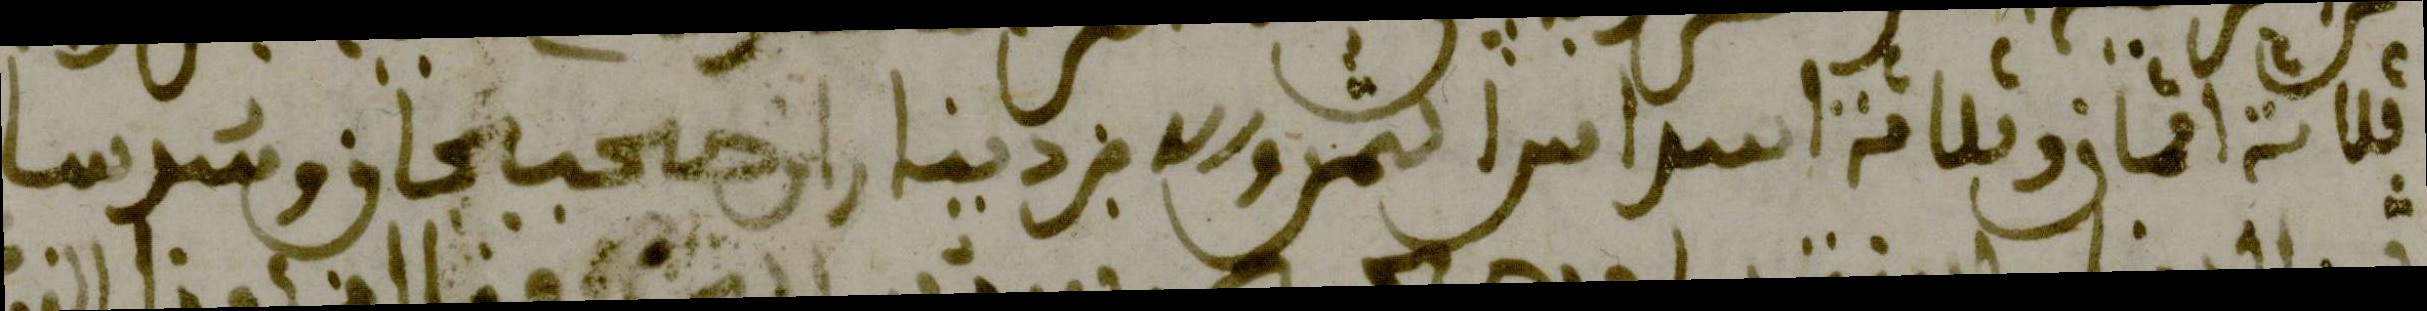ثلالة اثمان وثلاثة اسداس الثمن والابن دينار ان صحيحان وسُدسا
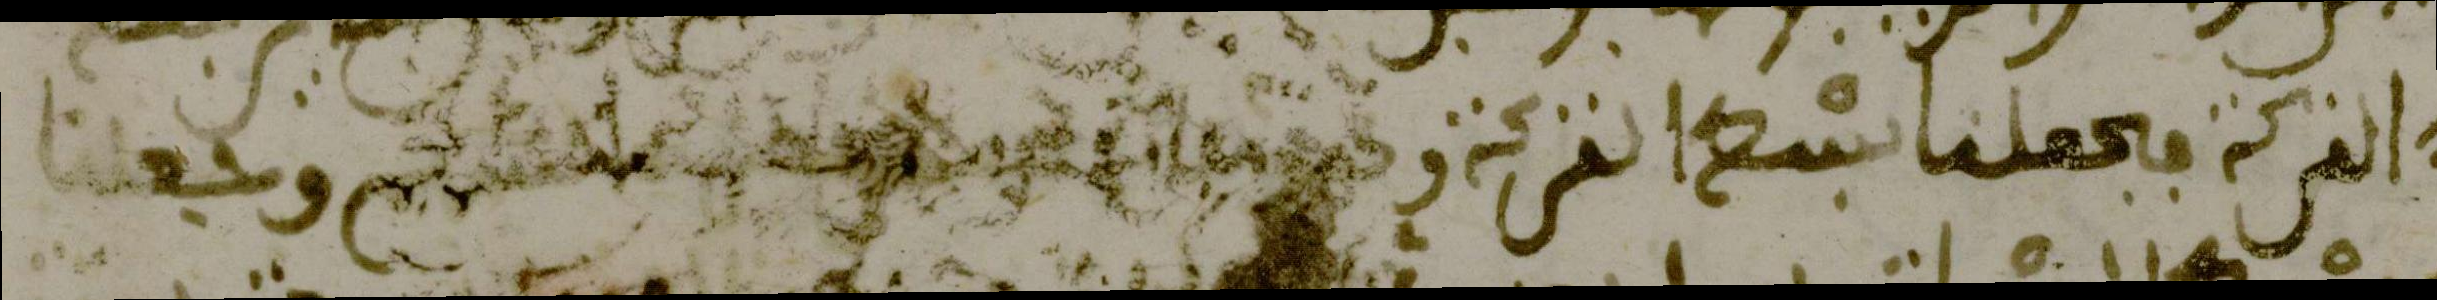التركة فجعلنا بسْط التركة وهي ثلاثة عشر حزء السهم وجعلنا
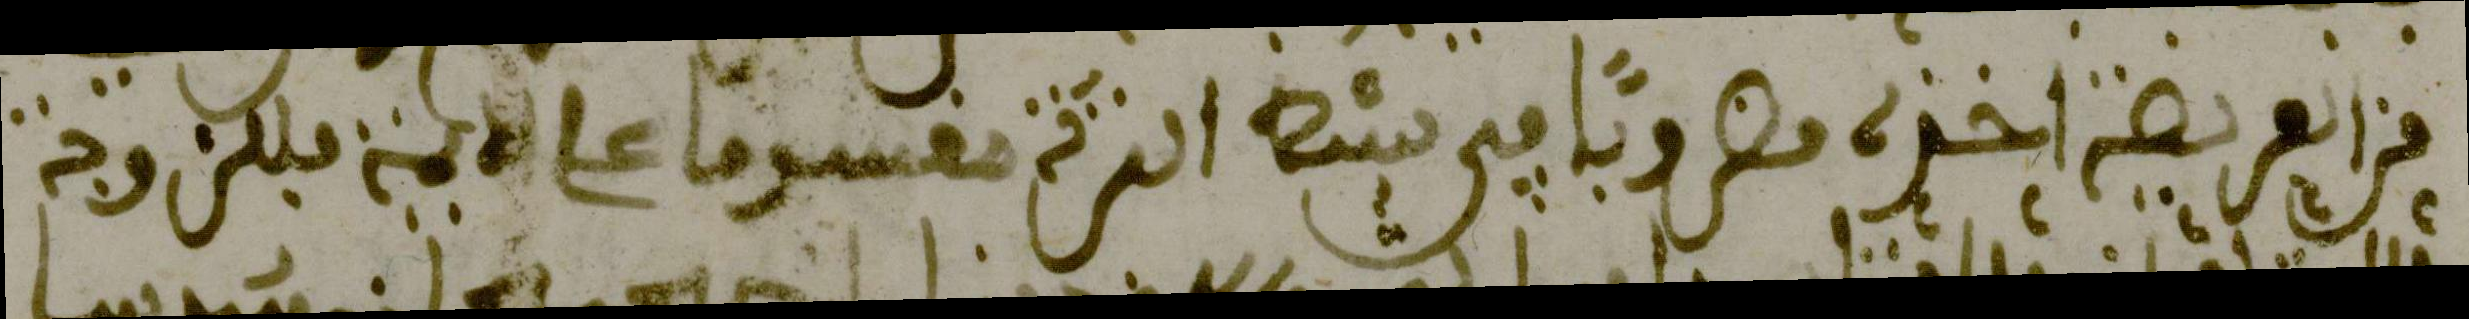من الفريضة اخذه مضروبًا في بسْط التركة مقسوما على الايمة فللزوجة
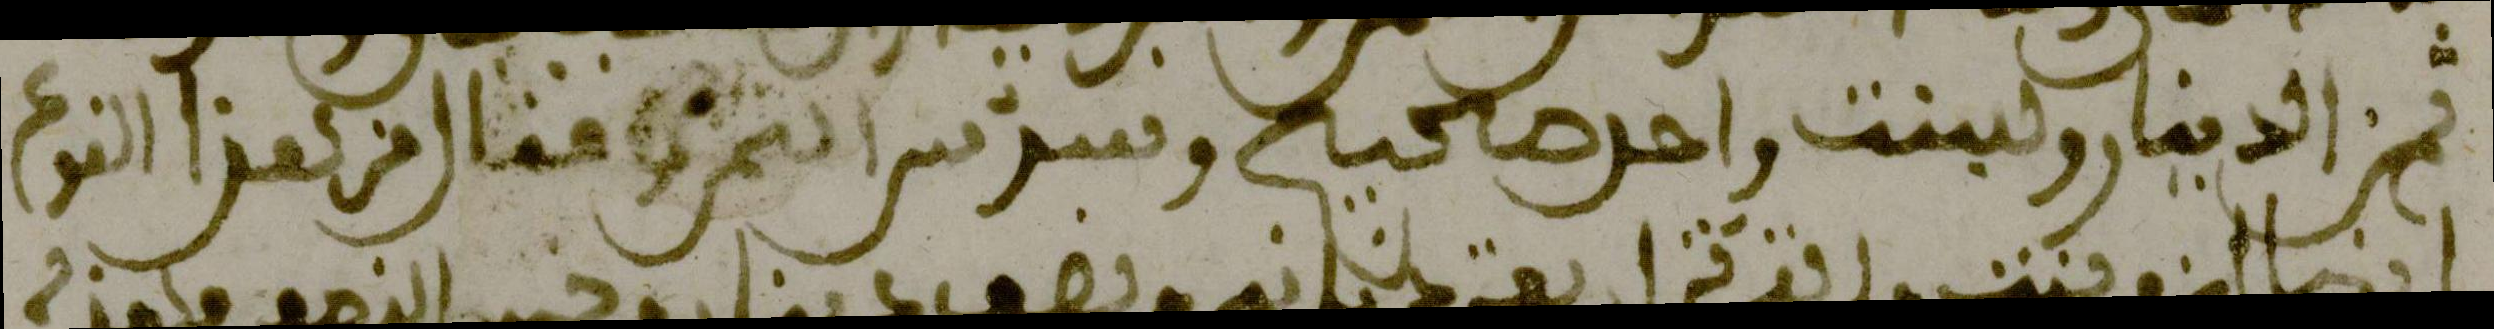ثمن الدينار ولبنت واحد صحيح وسدس الثمن مثال من هذا النوع
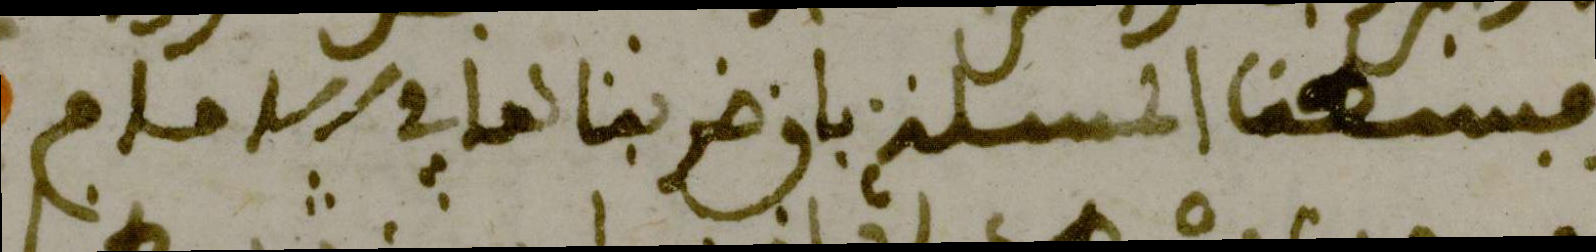فبسطنا المسلة بان ضربناها في الامام
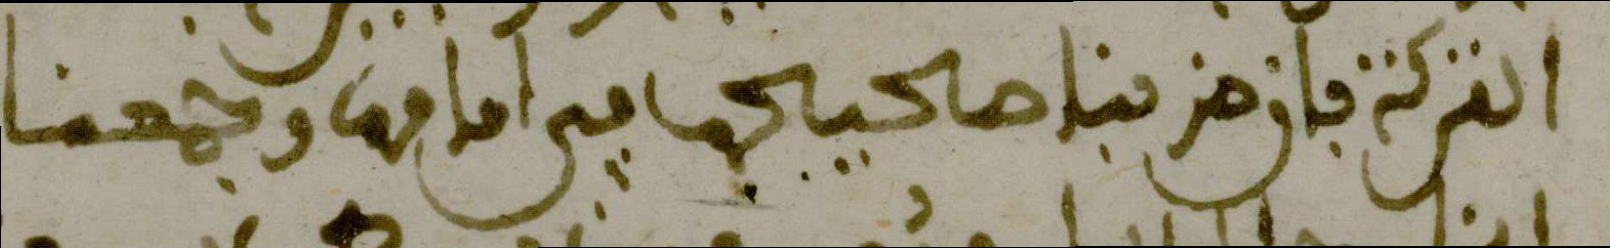التركة فان ضربنا صحيحها في امامها وجمعنا
